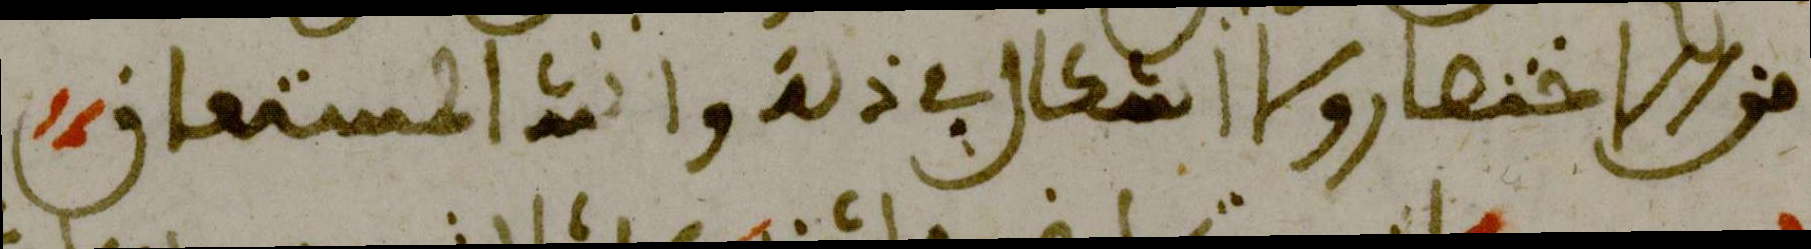من اختصار والاشكال في ذلك والله المستعان
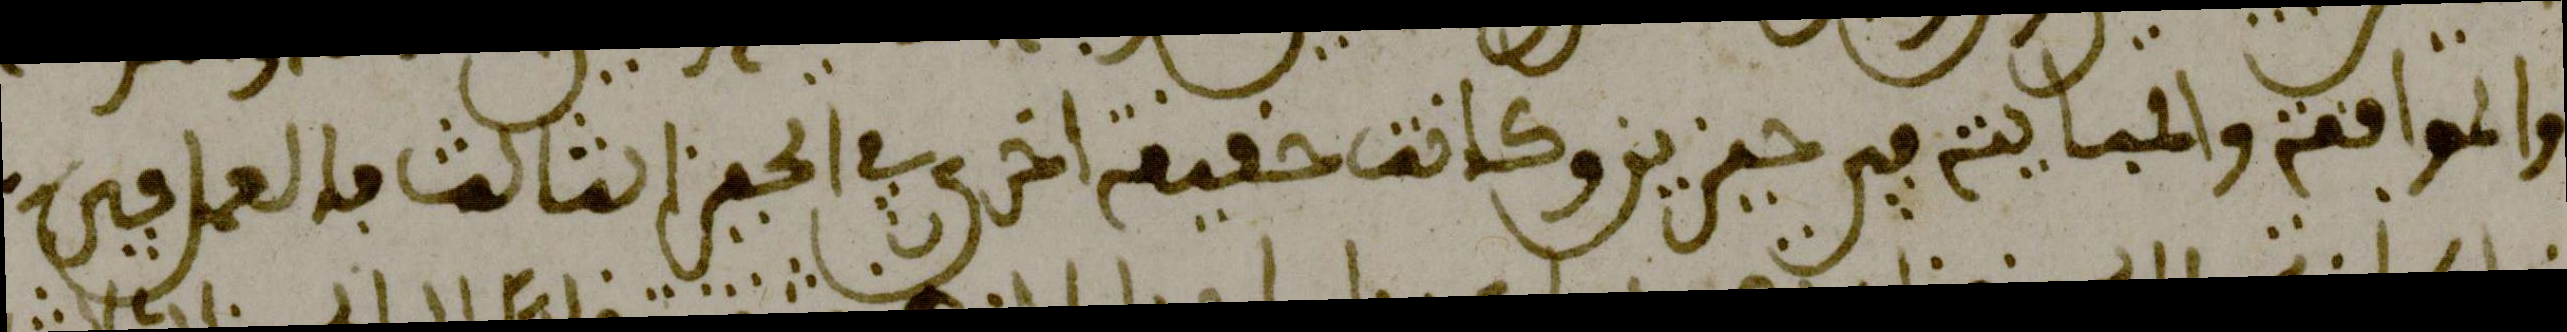والموافقة والمباينة في حيزين وكانت حقيقة اخرى في الحيز الثالث فالعمل في
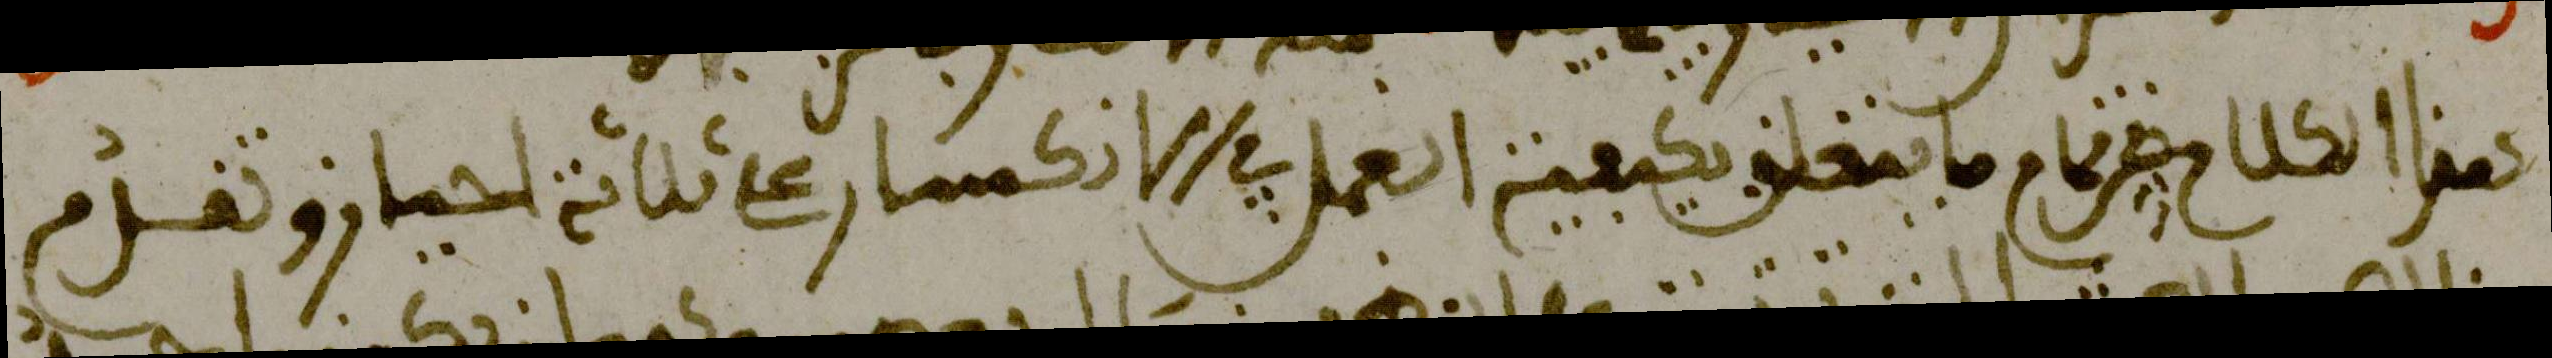هذا الكلام من تمام ما يتعلق بكيفية العمل في الانكسار على ثلاثة احياز وتقدم
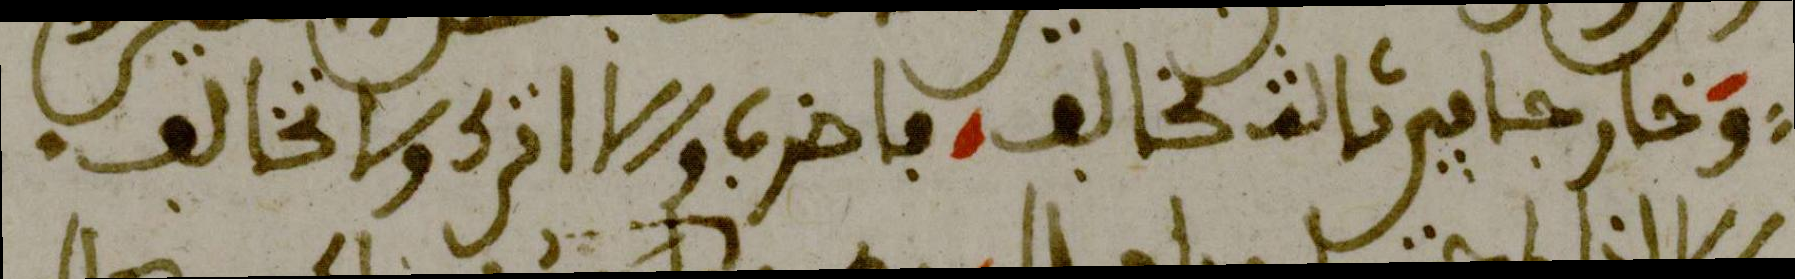وَخارجا في ثالث مخالف فاضرب والا اترك ولا تخالف
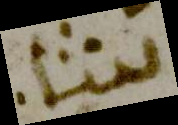شا
